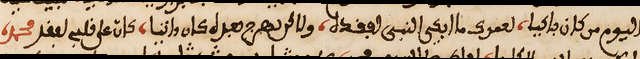اليوم من كان باكيا لعمرك ما ابكي لفقده ولاكن لهرج هده كان ءاتيا كان على قلبى لفقد محمد
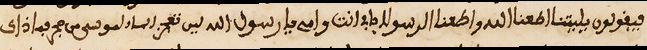فيقولون يليتنا اطعنا الله واطعنا الرسولا بابى انت وامى يا رسول الله لين تعجز الماء لموسى من حجر فما ذاك
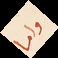واما
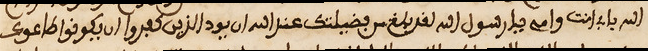الله يابى انت وامى يا رسول الله لقد بلغ من فضيلتك عند الله ان يود الذين كفروا ان يكونوا طاعوك
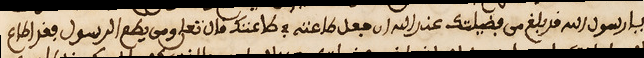يا رسول الله قد بلغ من فضيلتك عند الله ان جعل طاعته في طاعتك قال تعلى ومن يطع الرسول فقد اطاع
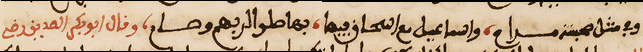وفي مثل صحبته مرام واسماعيل مع اسحاق فيها بها صلوا لربهم وصام وقال ابو بكر الصديق رضى
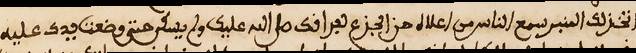اتخذ لك المنبر سمع الناس من اعلاه حن الجذع لفراقك صلى الله عليك ولم يسكن حتى وضعت يدك عليه
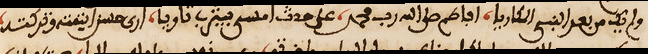ولم يك من بعد النبى المكاويا افاطم صلى الله رب محمد على حدث امسى بيثرب ثاويا ارى حسن ايتمته وتركته
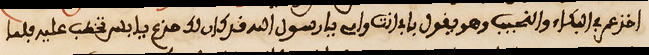اخذ عمر في البكاء والنجيب وهو يقول بابى انت وامى يا رسول الله قد كان لك حذع يل بس تخطب عليه فلما
